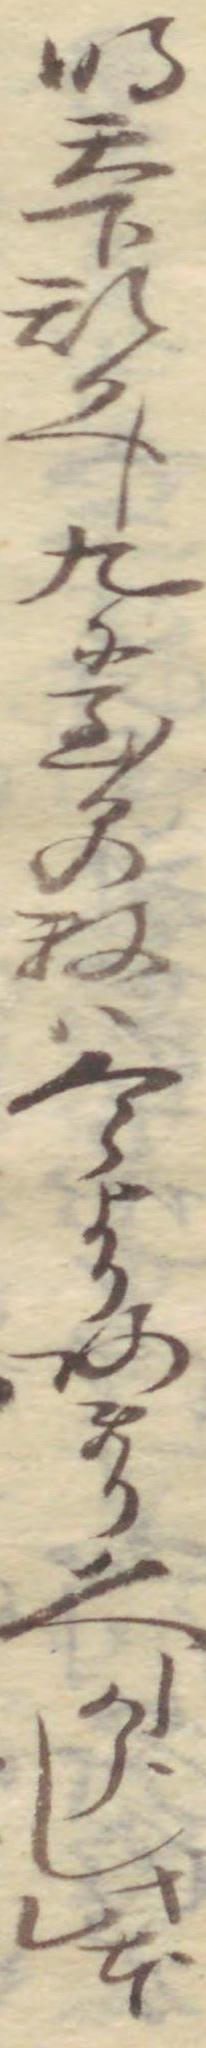時天下乱るへし九に至るの数は今よりあまり久しからし此本
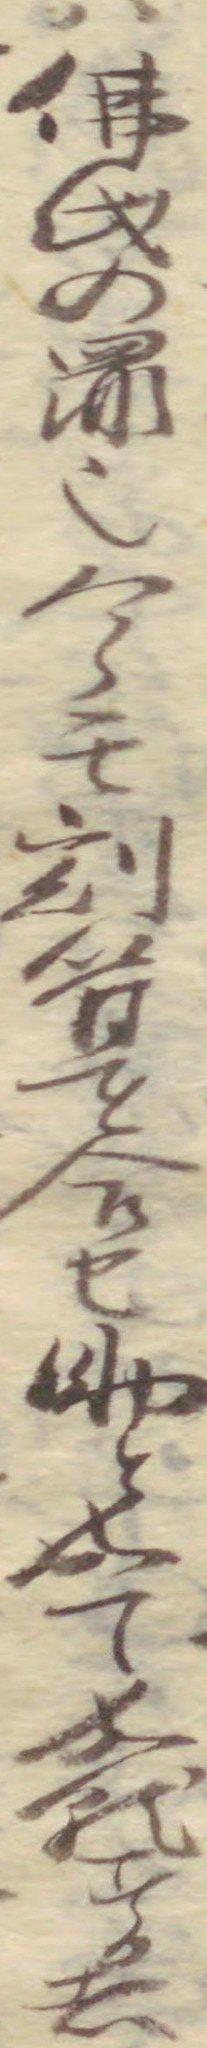は仏氏の罪なり今其割符を合せ助と成て成就する者
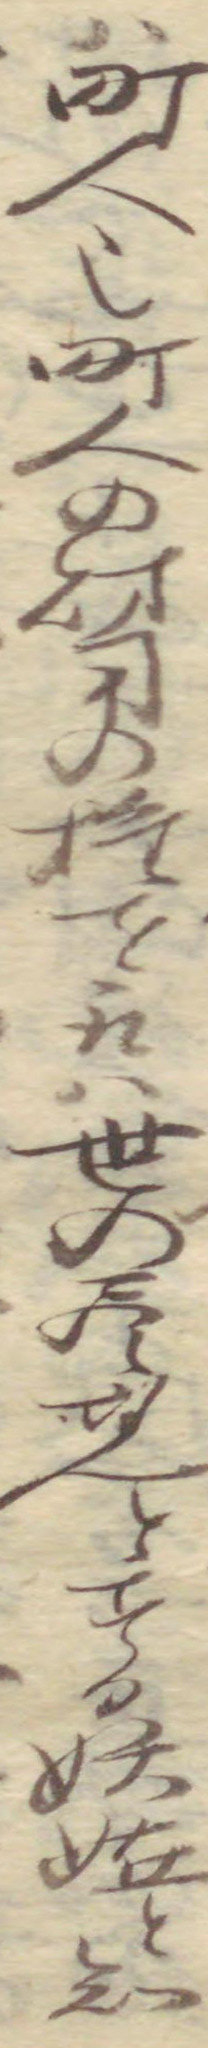は町人也町人の財用の権を取は世の尽なんとする妖怪と知
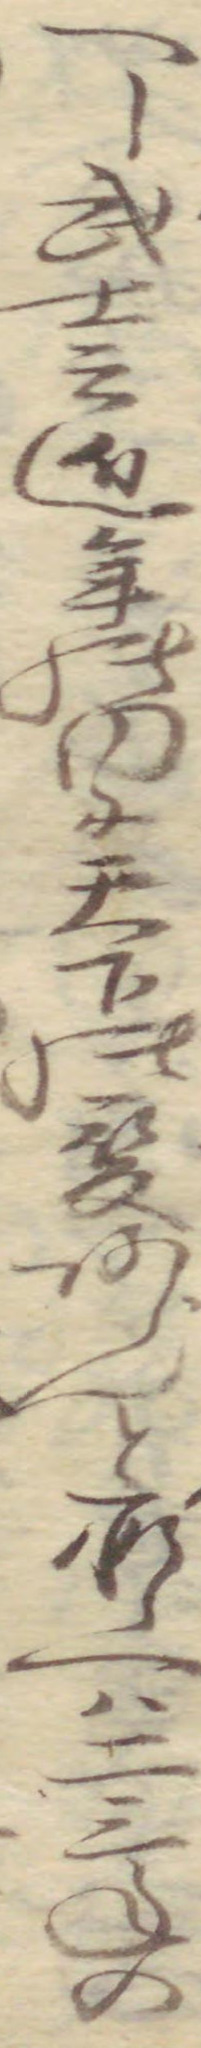へし武士云近年の内に天下の変あらんと承候へは二三年の
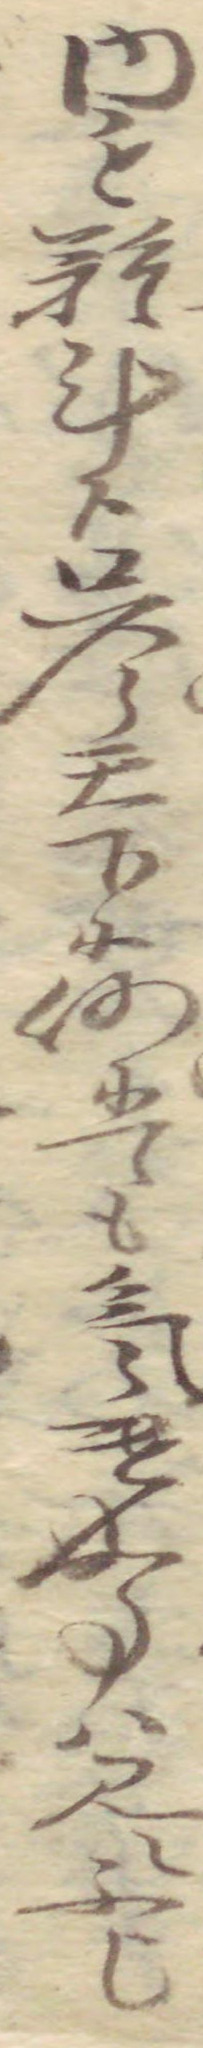内も難計候只今天下に何にても気遣成事は見え不申候
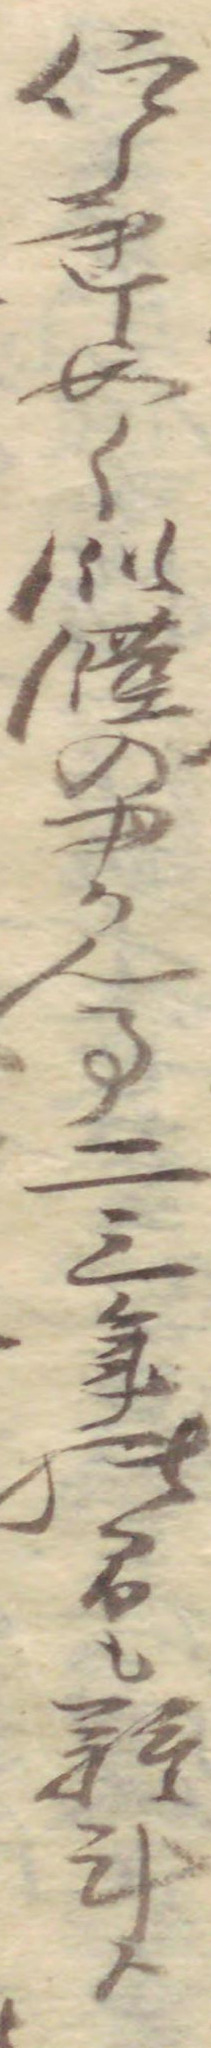仰られ候如く飢饉のゆかん事二三年の間も難計候
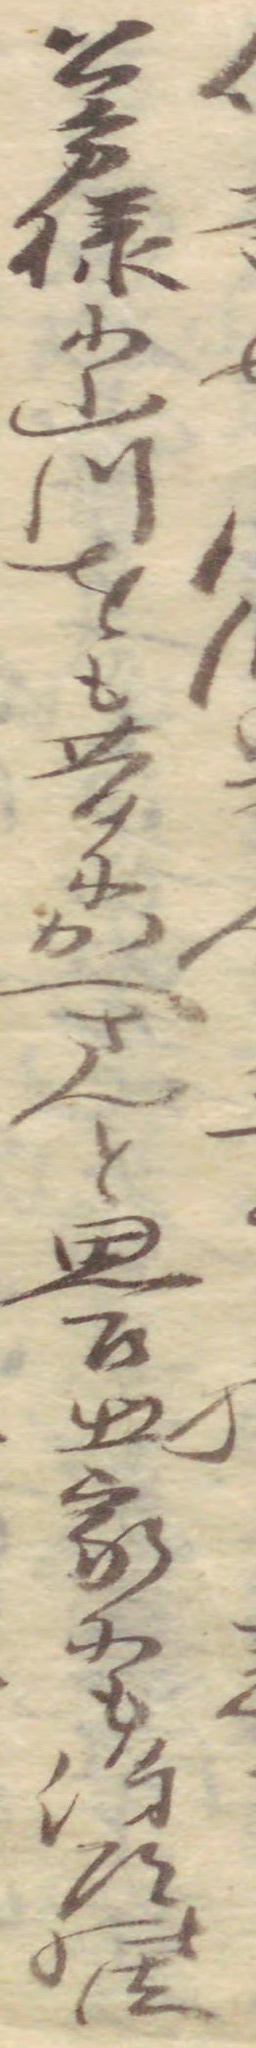公方様に山川をも昔にかへさんと思召出家にも得道の法
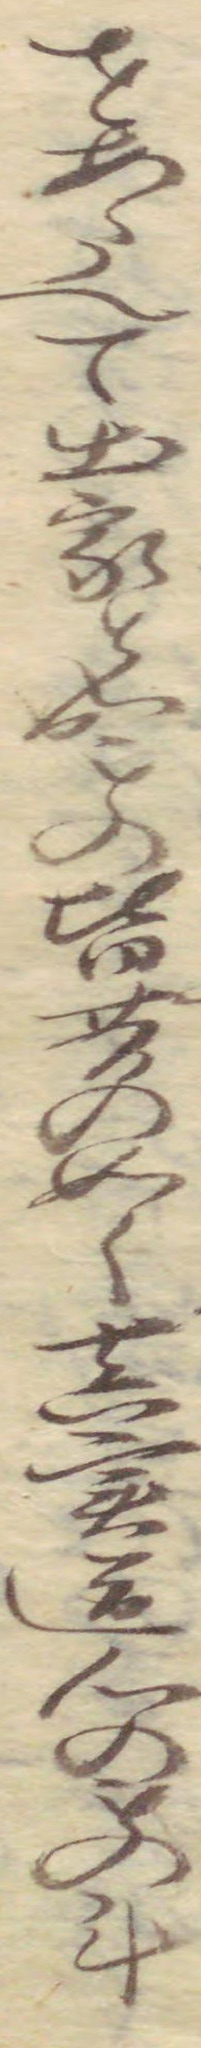をあたへて出家と成もの皆昔の如く真実道心のもの計
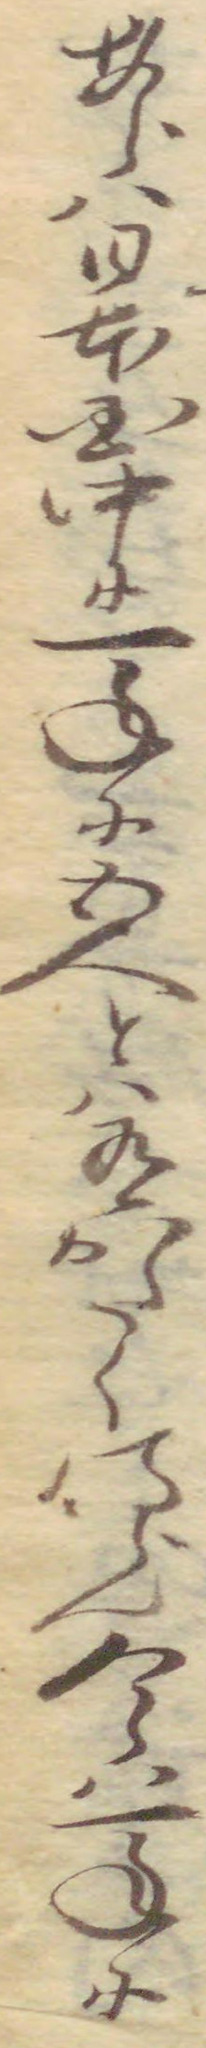ならは日本国中に一年に五人とは有かたく侍らん今は一年に

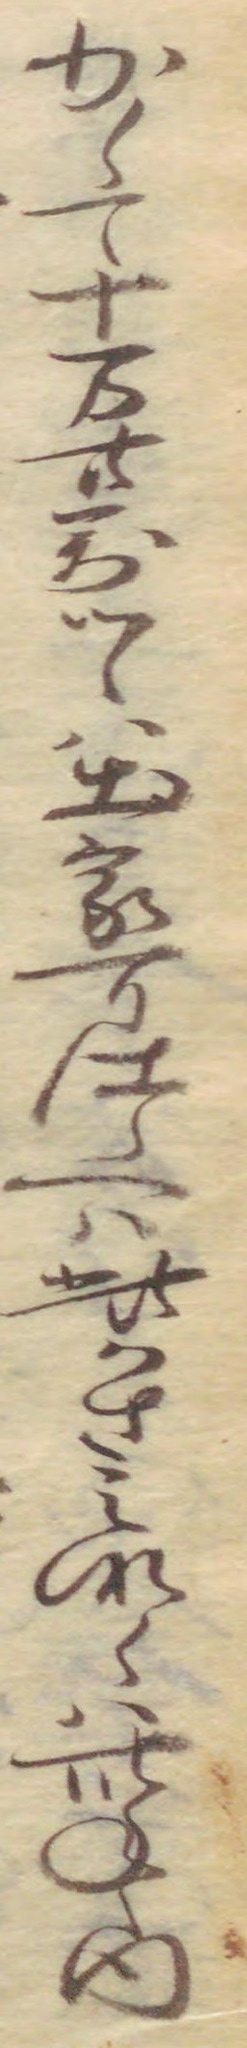少くて十万廿万ツヽは出家可仕候へは此かさみなくは卅年之内
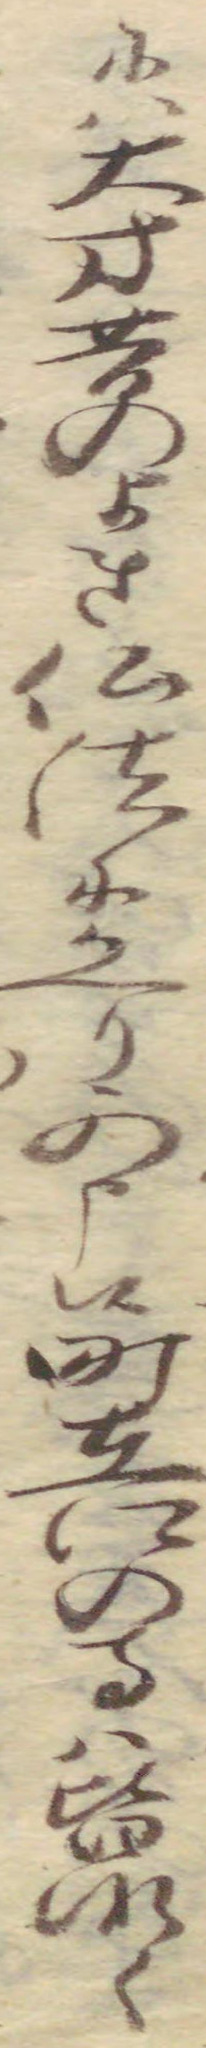には大方昔のよき仏法にかへり可申候町在郷の寺は皆なく
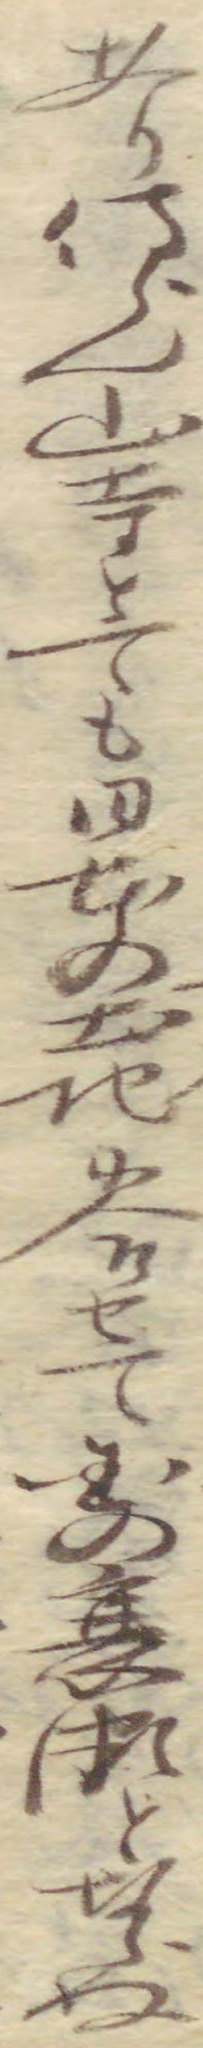なり侍らん山寺とても日本の土地に合せて国の衰微とならぬ
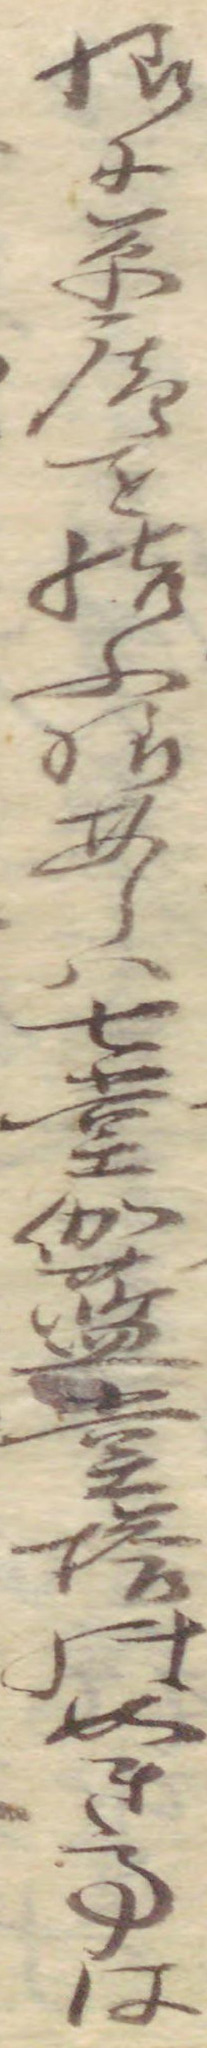様に草庵を結ふ様ならは七堂伽藍堂塔の如き事は
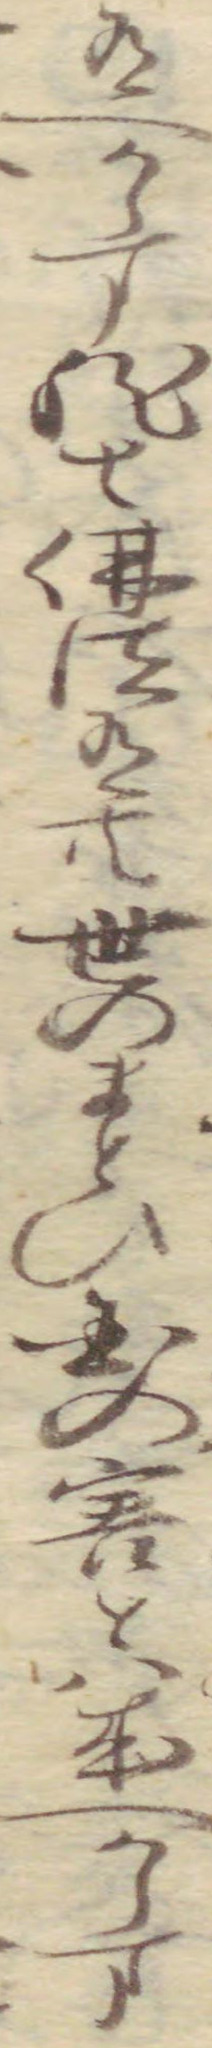有へからす然は仏法有共世のまとひ国の害とは成へからす
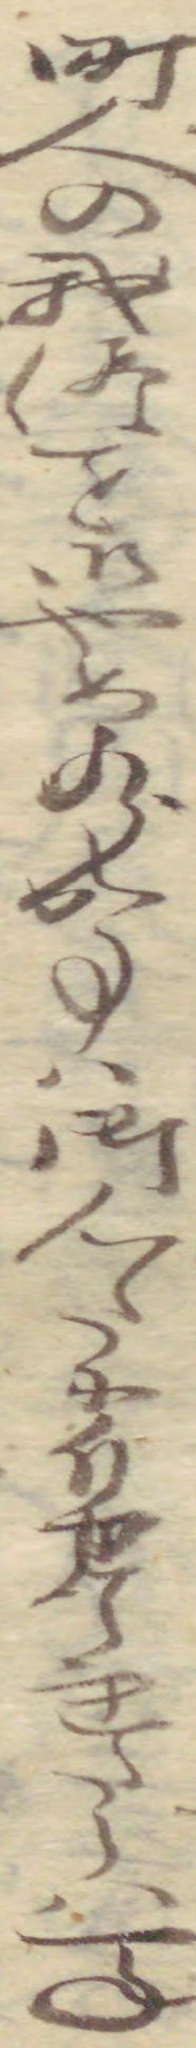町人の我侭を御やめ可被成事は御心たに付せられたらは一年
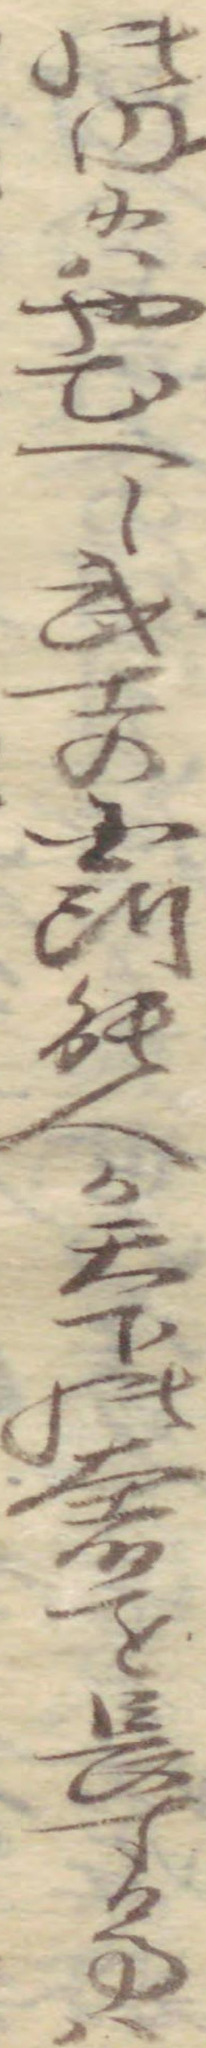の内にはやむへし武士の国所能人か天下の奢を長する事は
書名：鶯宿雑記. 巻263-264
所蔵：国立国会図書館 National Diet Library, JAPAN
